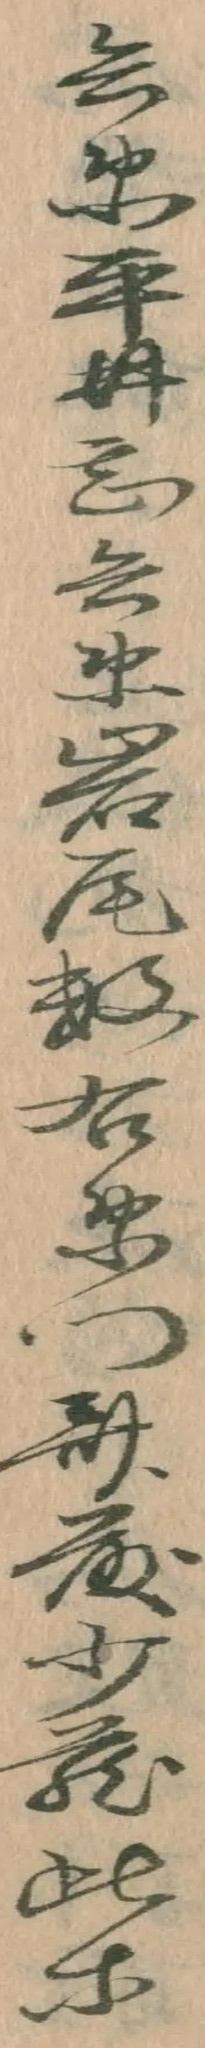兵衛平井甚兵衛岩尾数右衛門斎藤少蔵此等
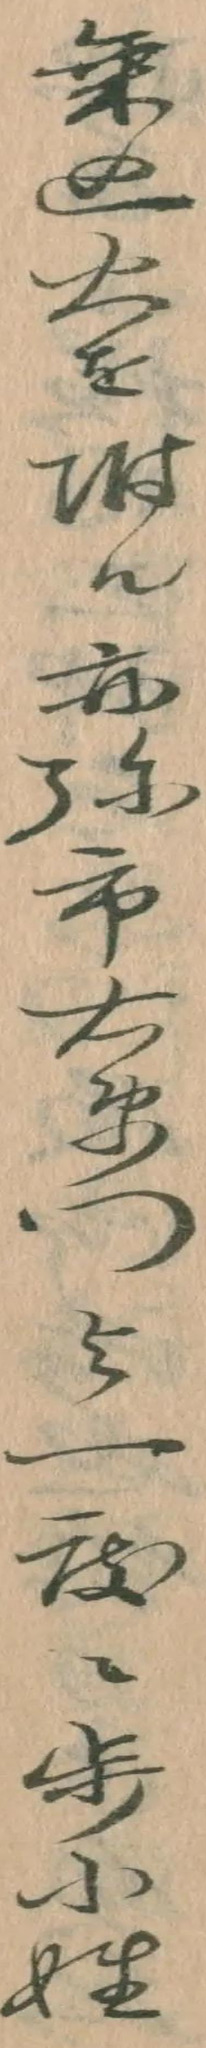乗込火を附ん亦弥市右衛門与一度に歩小姓
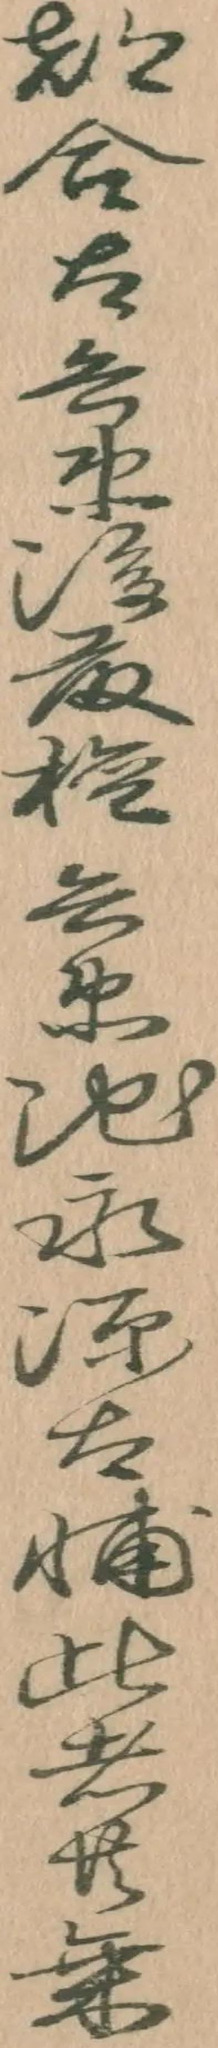都合太兵衛後藤権兵衛池永源太輔此者共乗
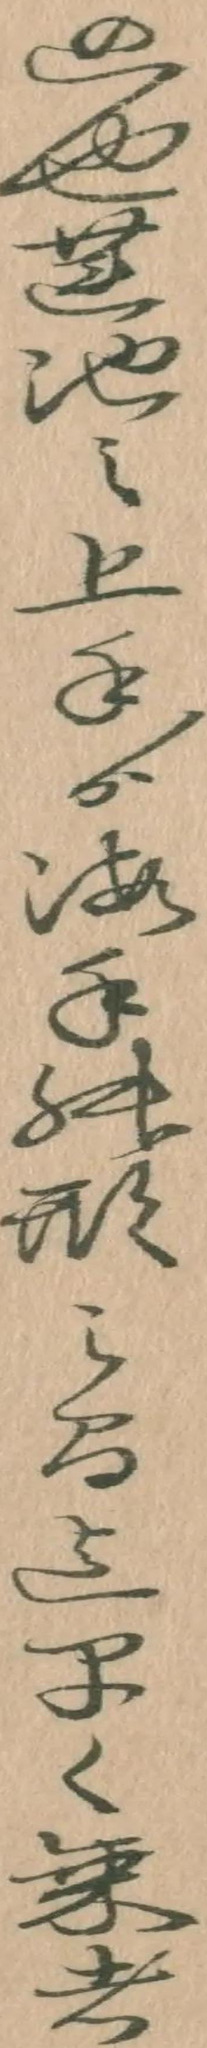込也蓮池之上手ゟ海手桝形之間迄早く乗者
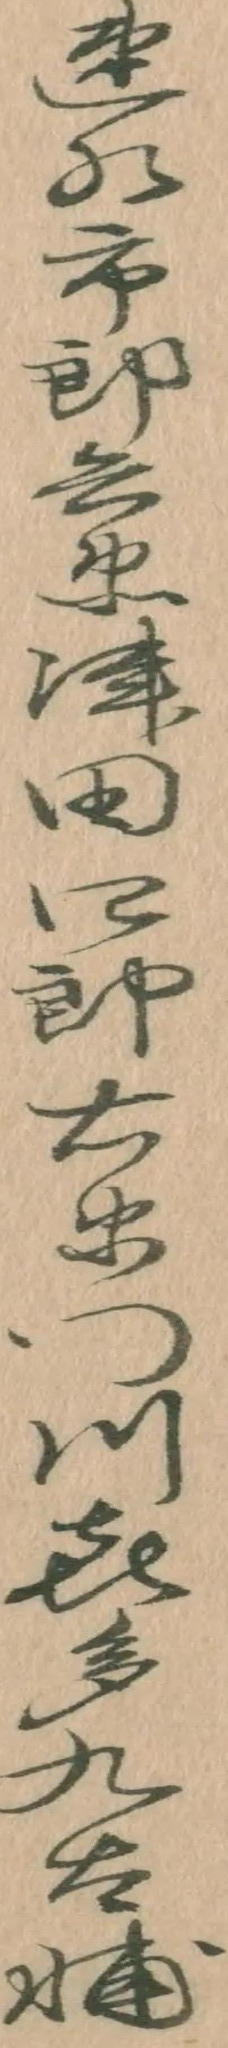速水市郎兵衛津田四郎右衛門川喜多九太輔
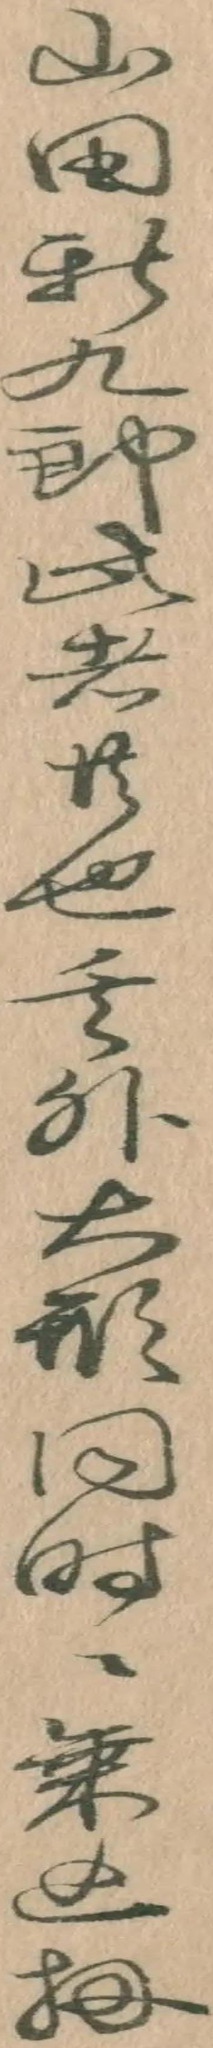山田新九郎此者共也其外大形同時に乗込扨
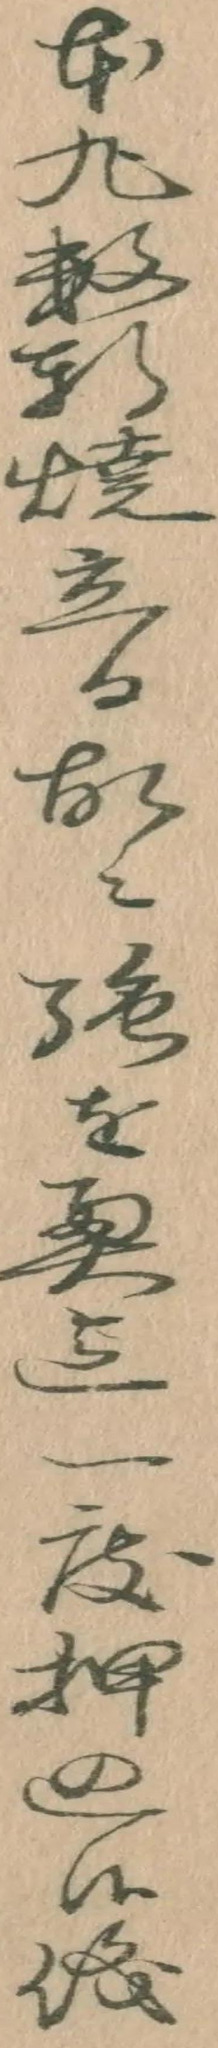本丸数軒焼立る故に強を奥迄一度押込候儀
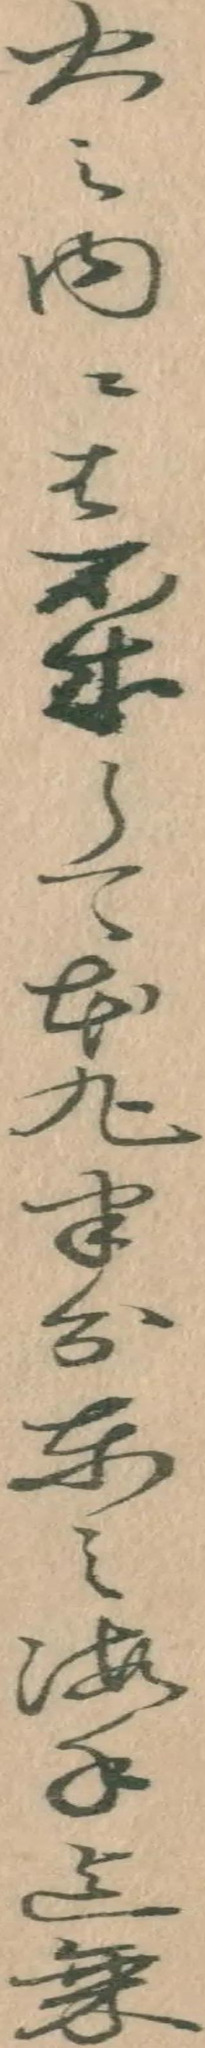火之内に者不成して本丸半分東之海手迄乗
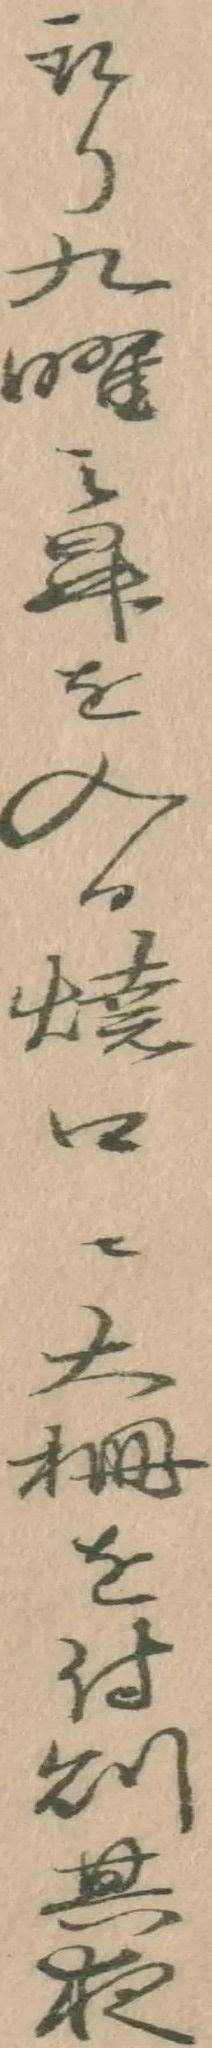取り九曜之昇を入る焼口に大柵を付則其夜
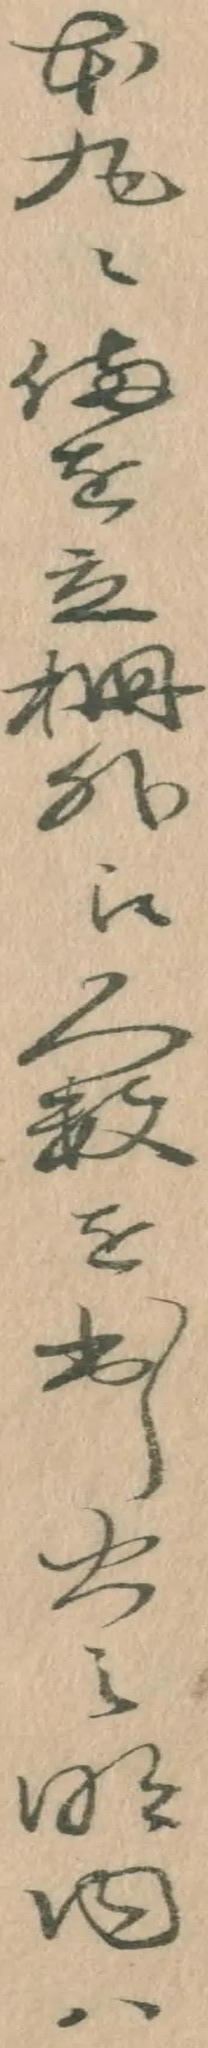本丸に備を立柵外江人数を出し火之明内は
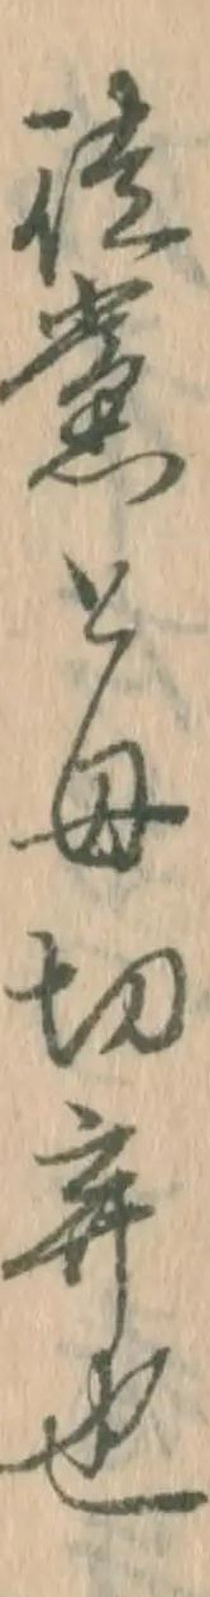徒党と母切弃也
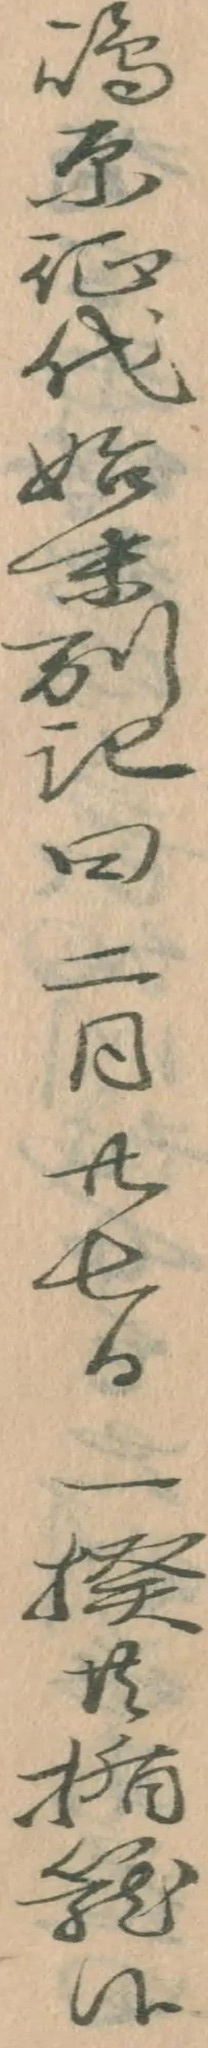島原征伐始末別記曰二月廿七日一揆共楯籠候

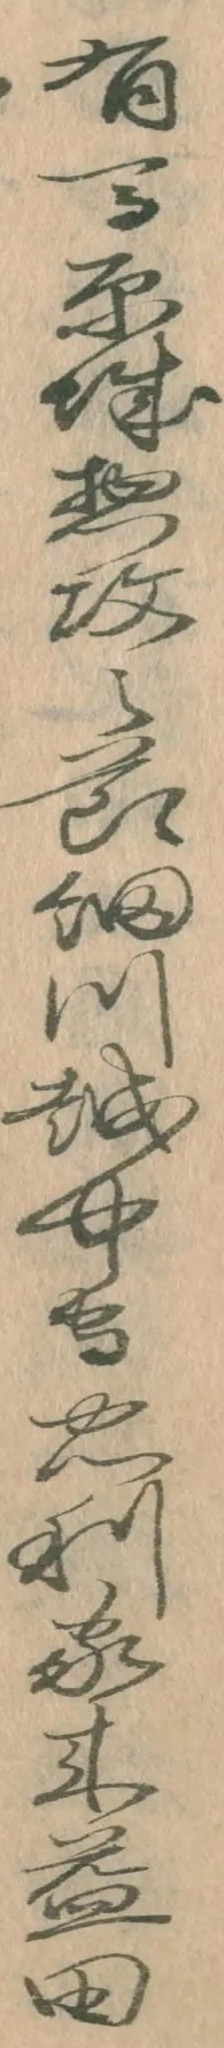有馬原城惣攻之節細川越中守忠利家来益田
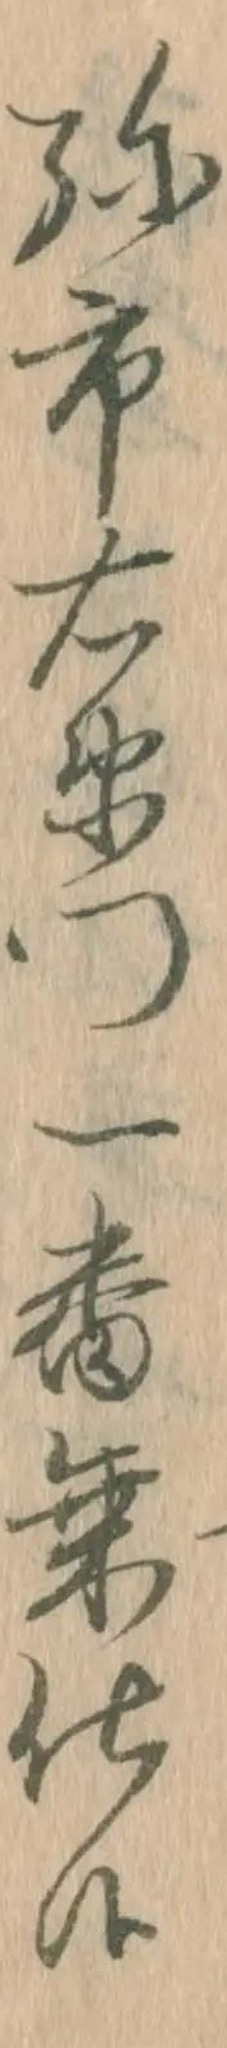弥市右衛門一番乗仕候

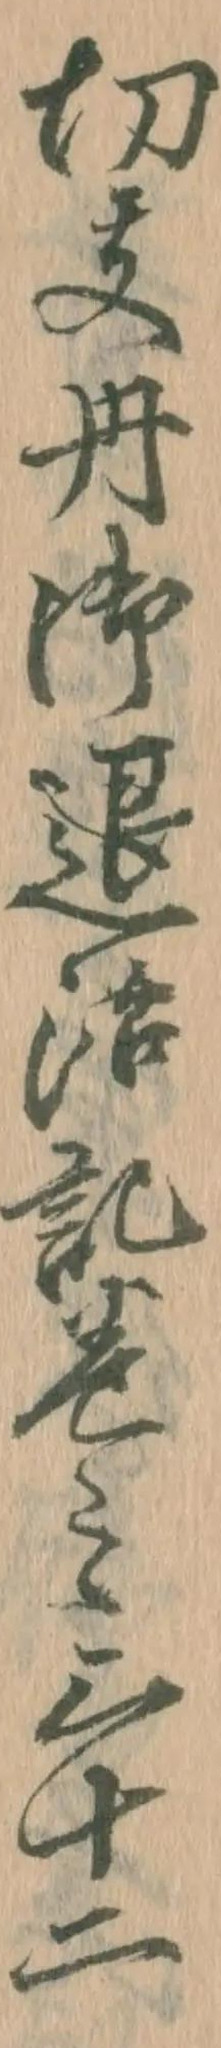切支丹御退治記巻之三十二
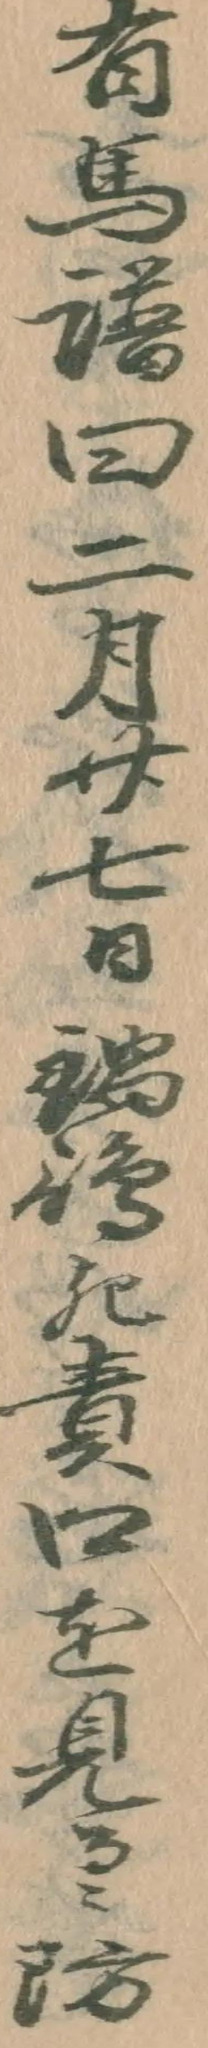有馬譜曰二月廿七日鍋島歟責口を見るに防
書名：切支丹御退治記 49巻. [8]
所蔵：国立国会図書館 National Diet Library, JAPAN
